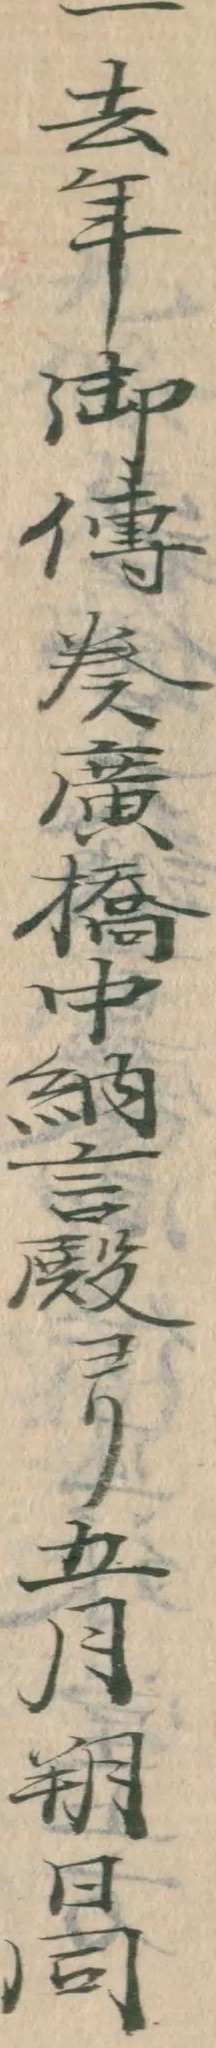一去年御伝奏広橋中納言殿ヨリ五月朔日同
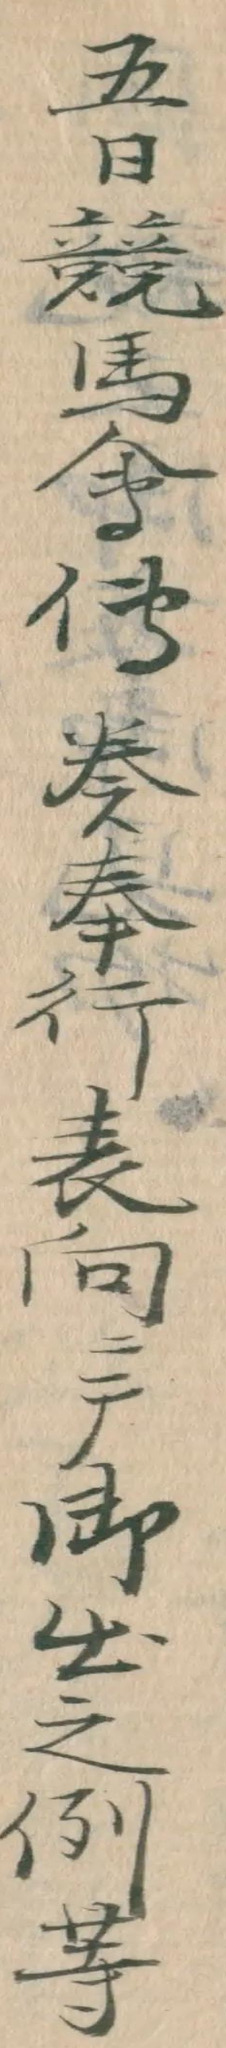五日競馬会伝奏奉行表向ニテ御出之例等
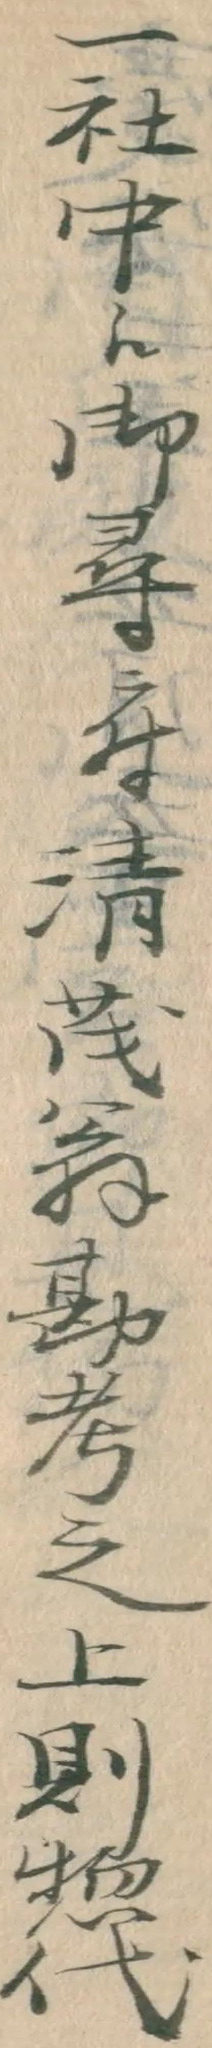一社中江御尋ニ付清茂翁勘考之上則惣代
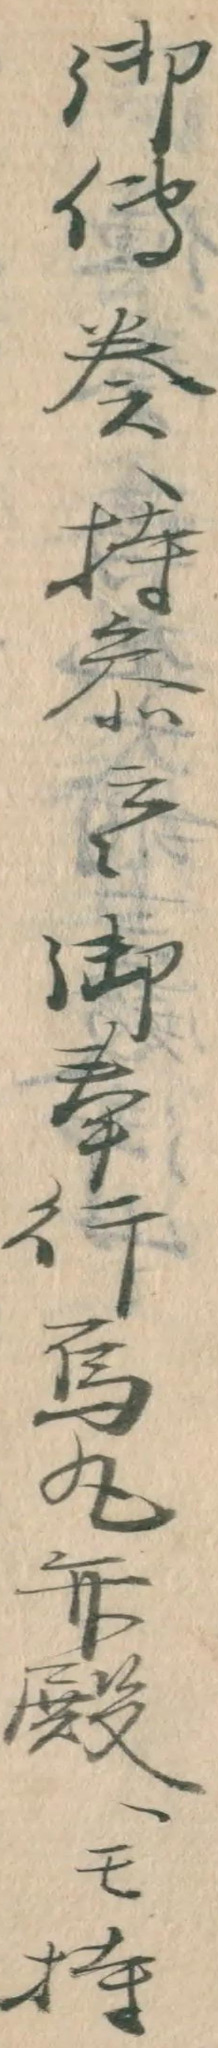御伝奏へ持参云々御奉行烏丸弁殿ヘモ持
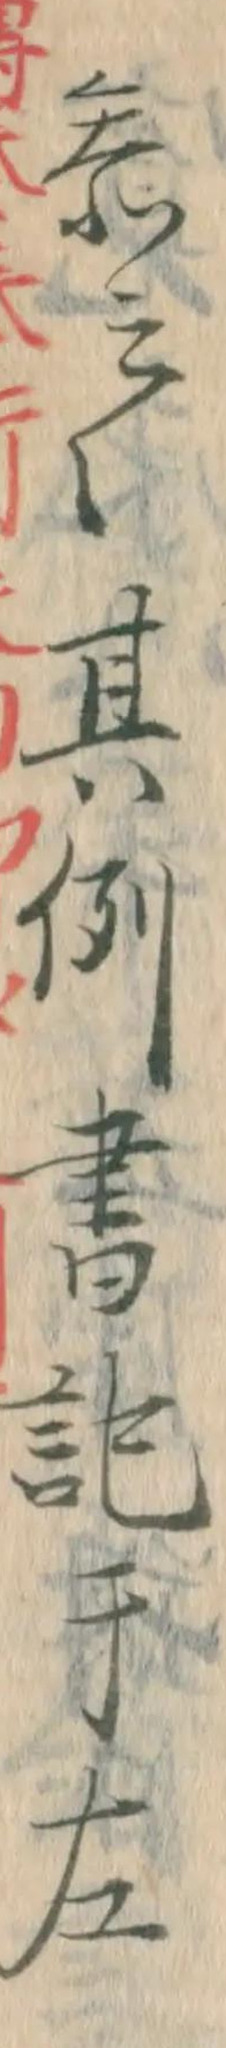参云々其例書記于左
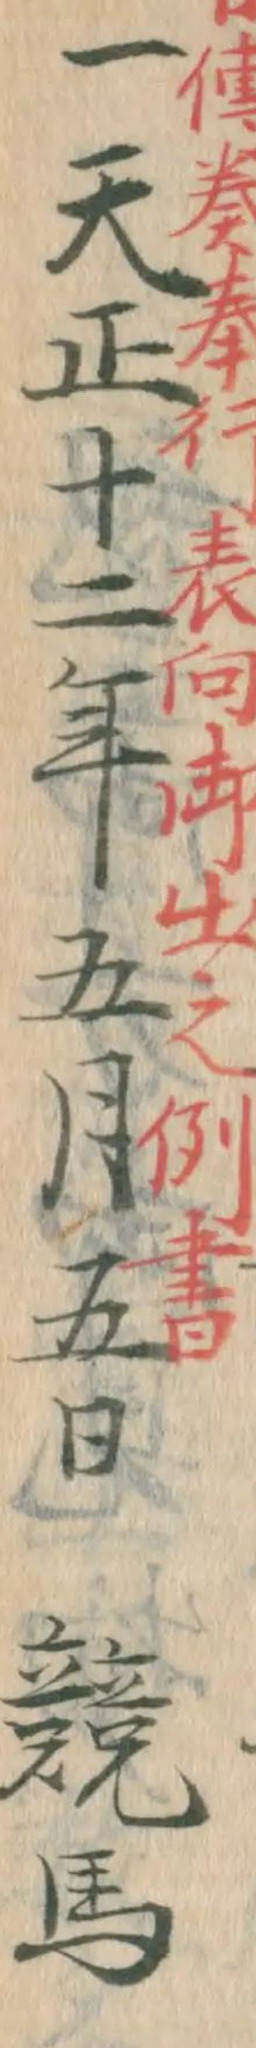一天正十二年五月五日競馬

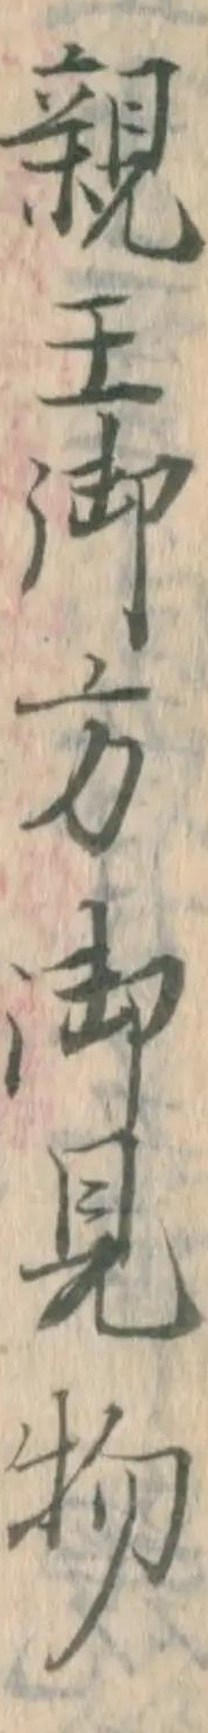親王御方御見物
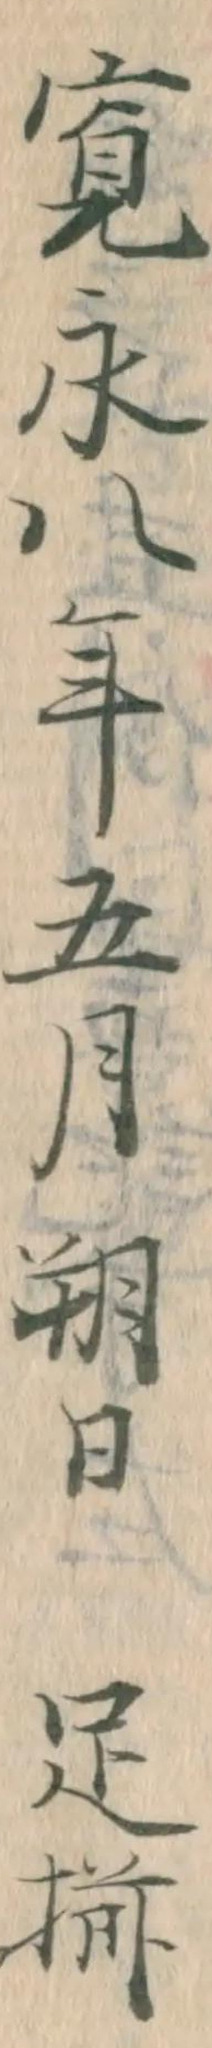寛永八年五月朔日足揃
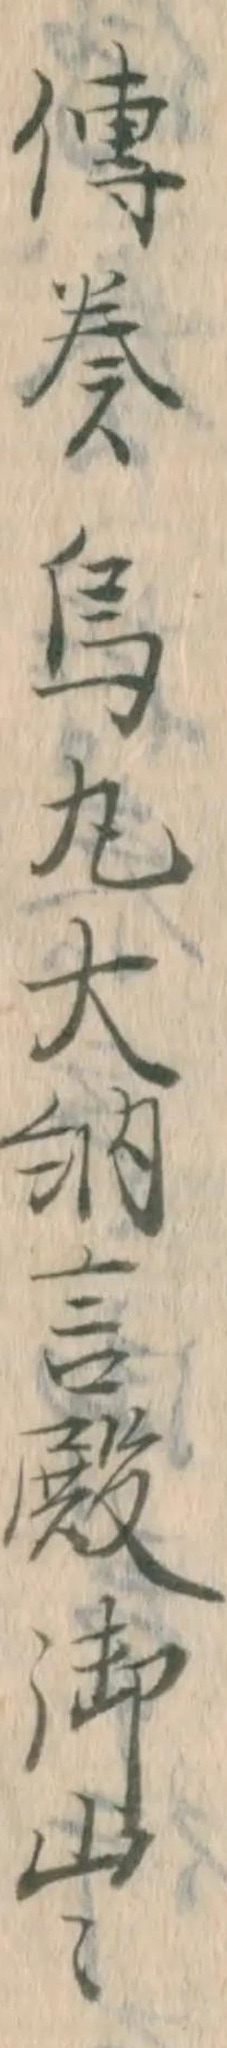伝奏烏丸大納言殿御出
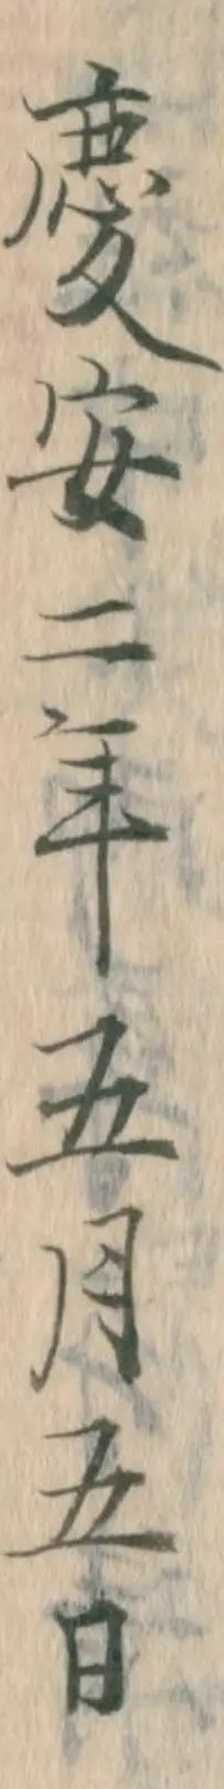慶安二年五月五日
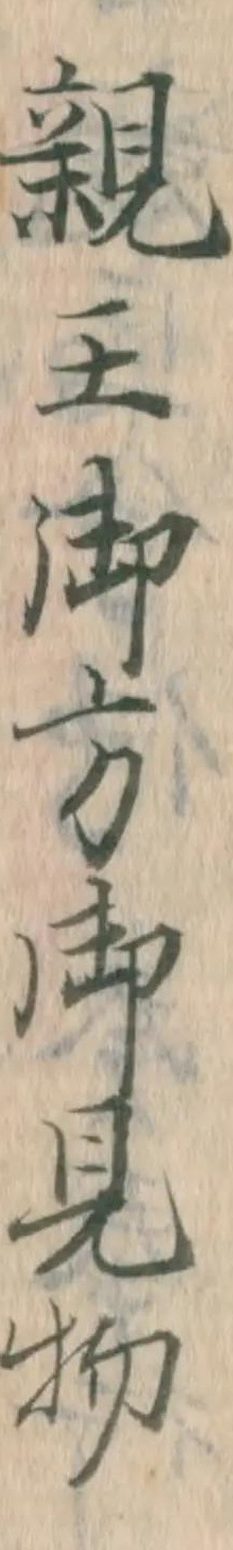親王御方御見物
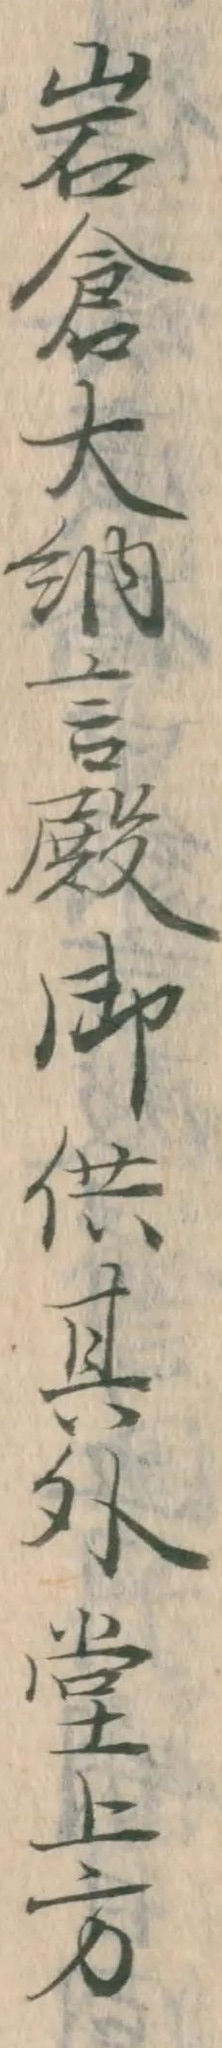岩倉大納言殿御供其外堂上方
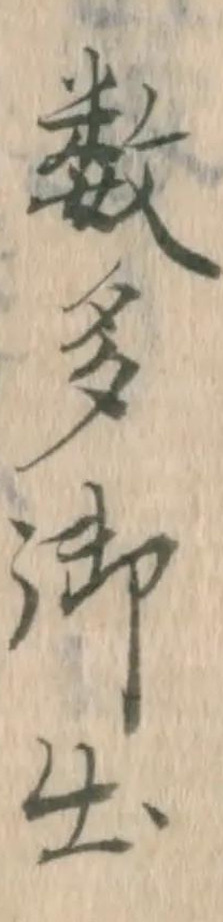数多御出
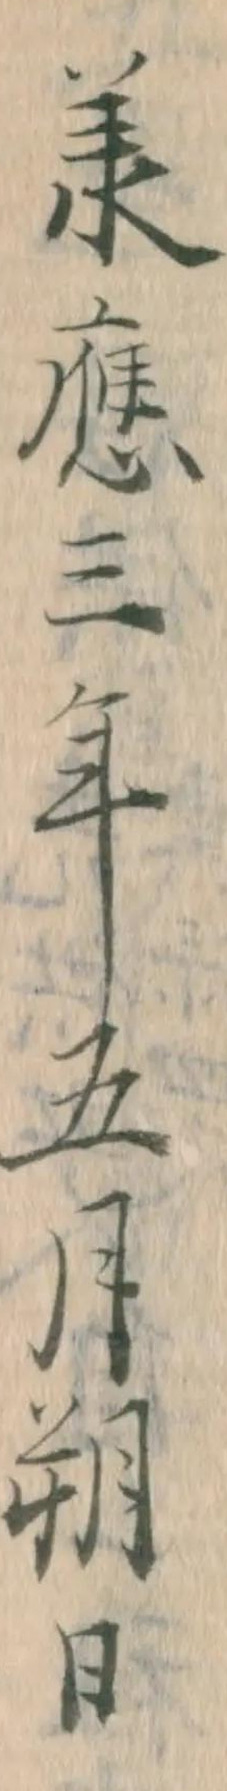承応三年五月朔日
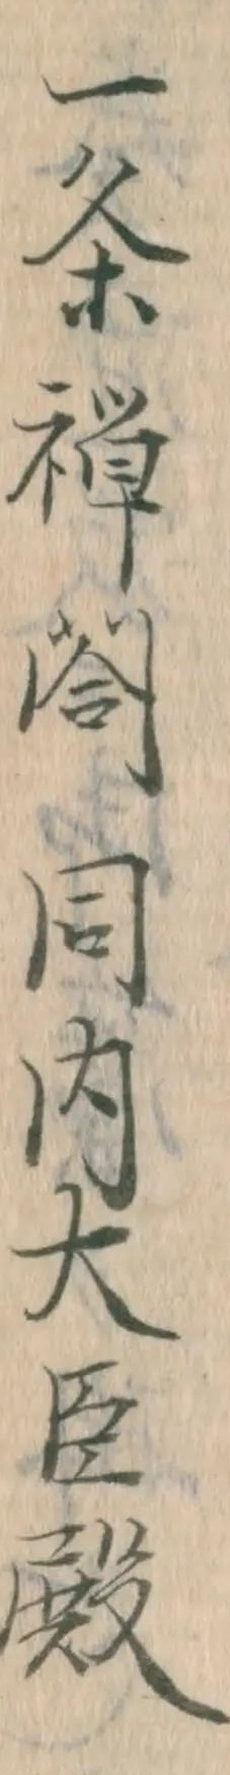一条禅閤同内大臣殿
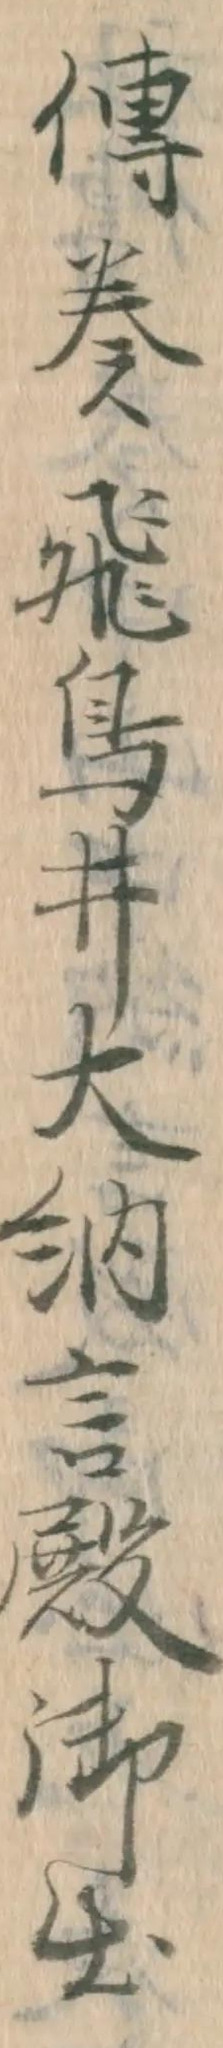伝奏飛鳥井大納言殿御出
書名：賀茂社記録. 第10冊
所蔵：国立国会図書館 National Diet Library, JAPAN
